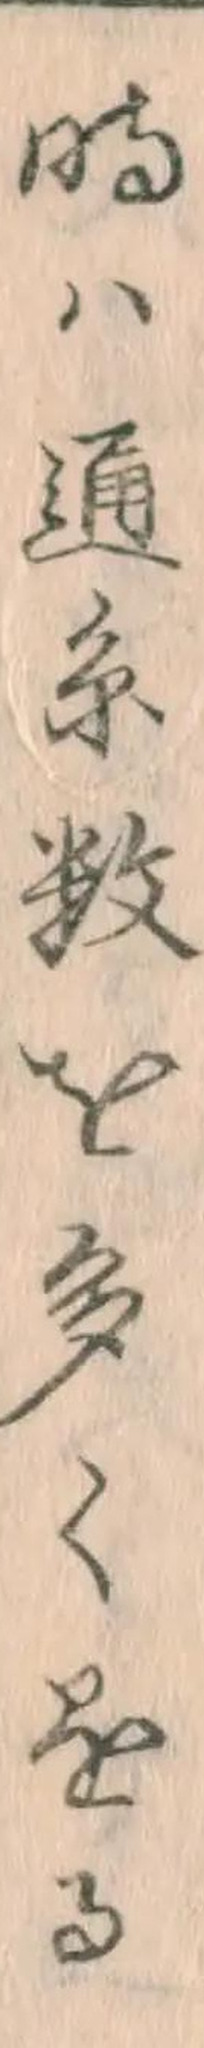時は通糸数を多く懸る
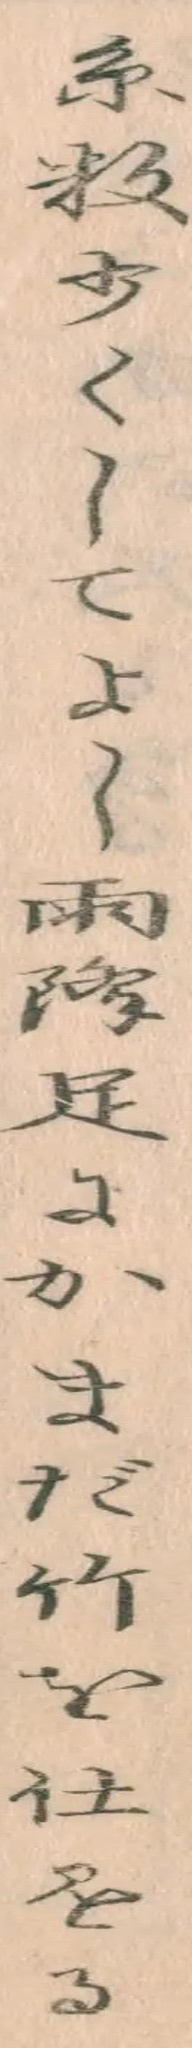糸数少くしてよし雨降足にかまだ竹を仕懸る
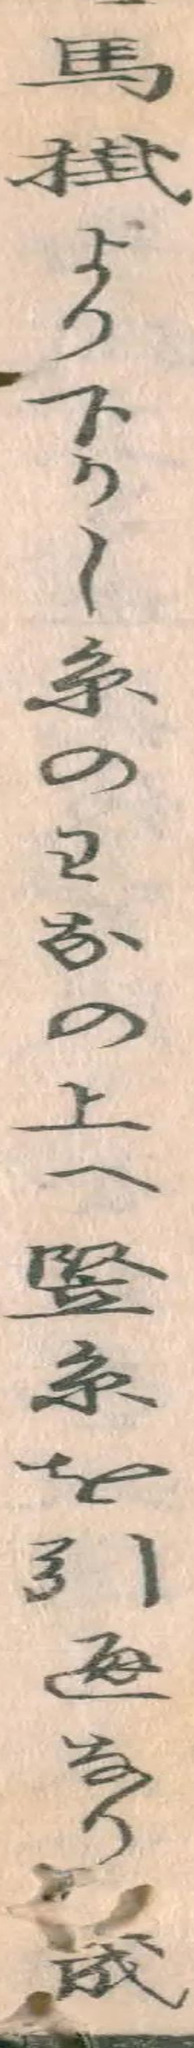一馬掛より下りし糸のわなの上へ竪糸を引通なり筬
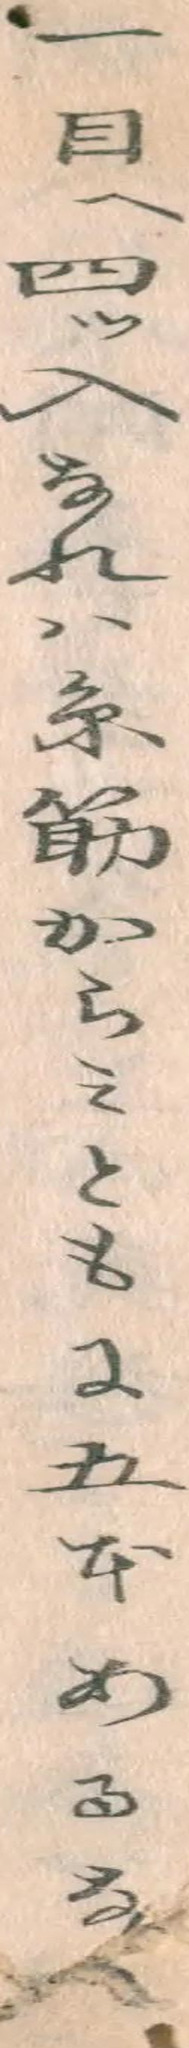一目へ四ッ入なれは糸筋からみともに五本あるなり
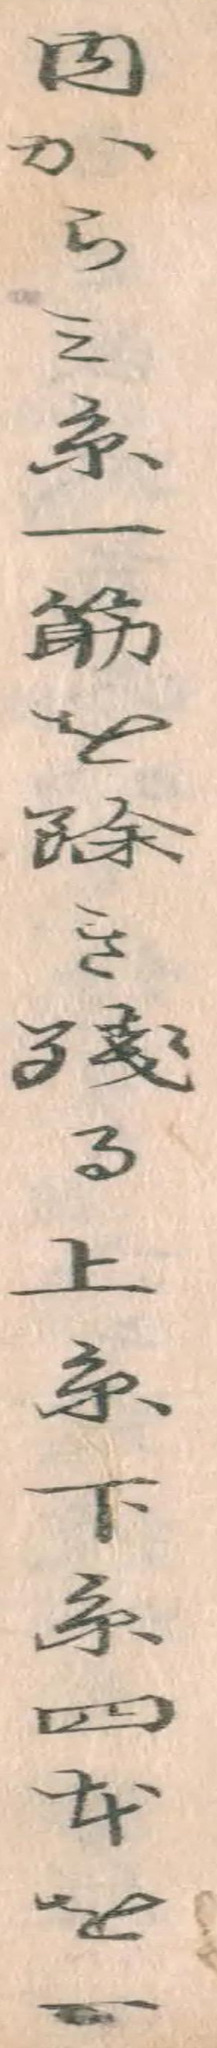内からみ糸一筋を除き残る上糸下糸四本を一
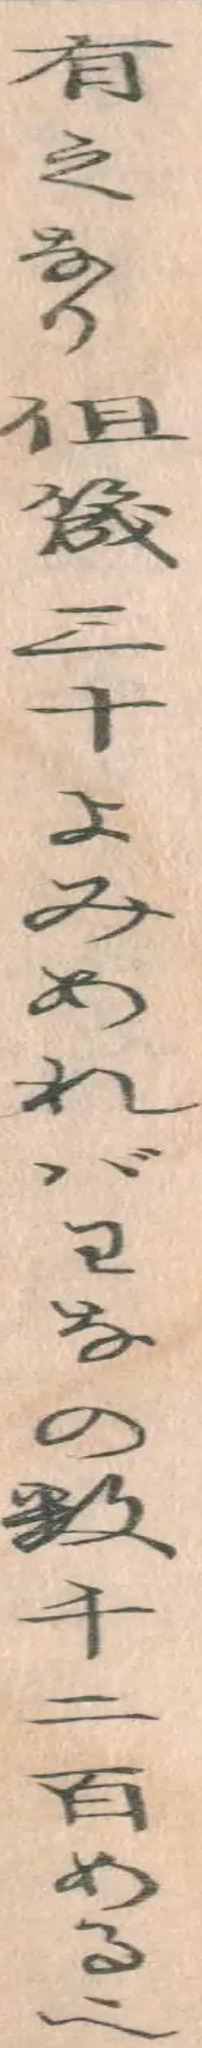有之なり但筬三十よみあればわなの数千二百ある也
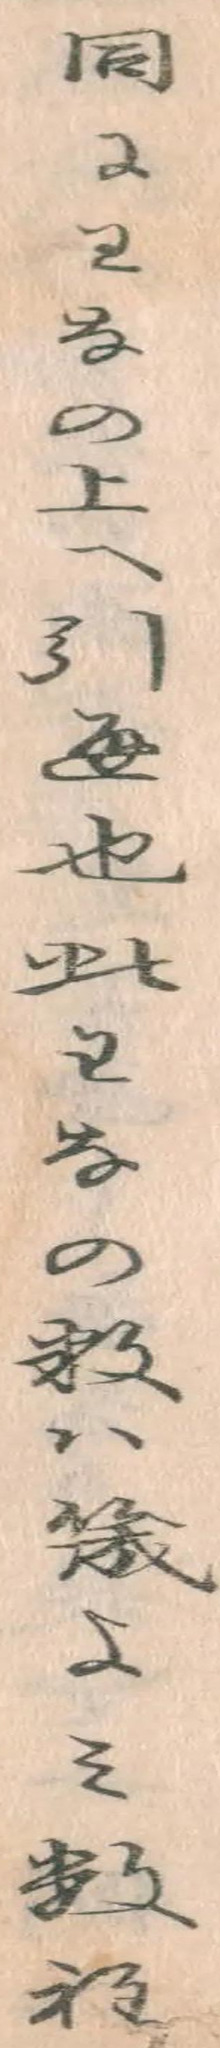同にわなの上へ引通也此わなの数は筬よみ数程

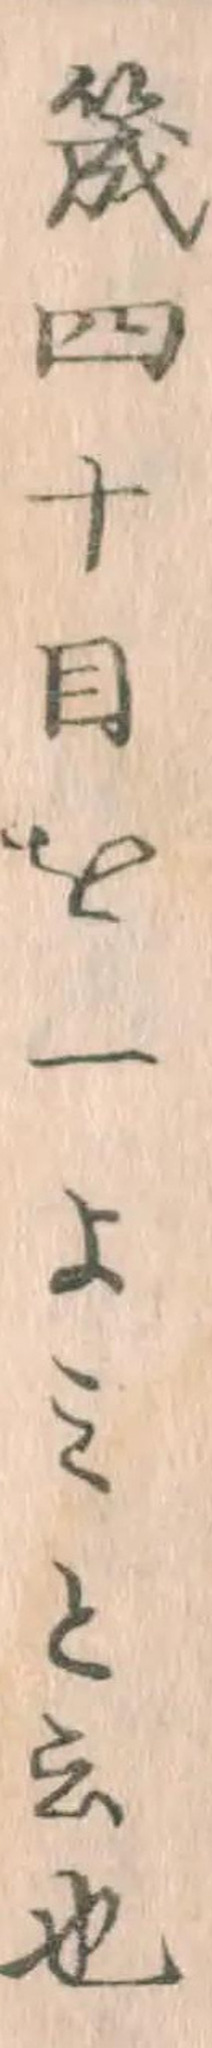筬四十目を一よみと云也
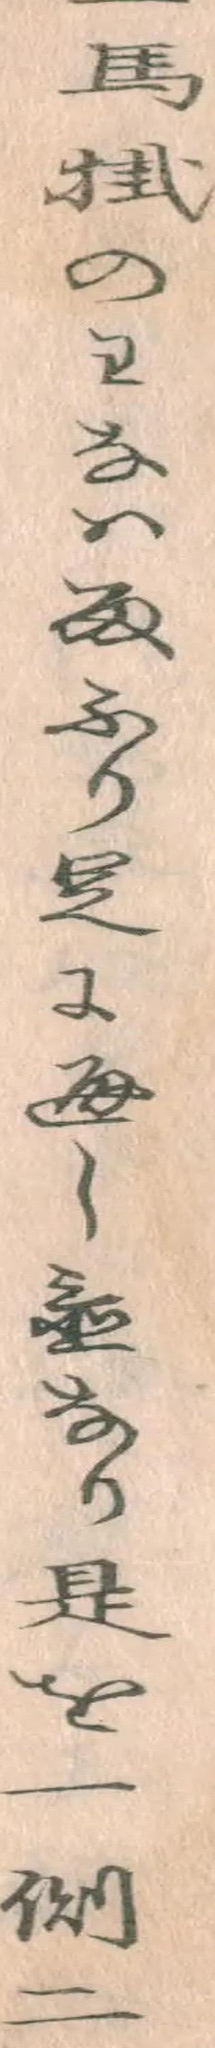一馬掛のわなは雨ふり足に通し置なり是を一側二
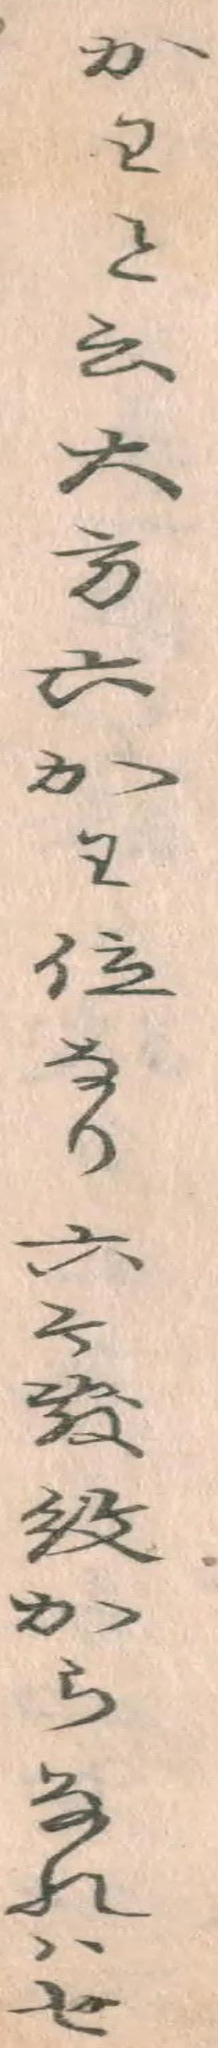かわと云大方六かわ位なり六ヶ敷紋からなれは七
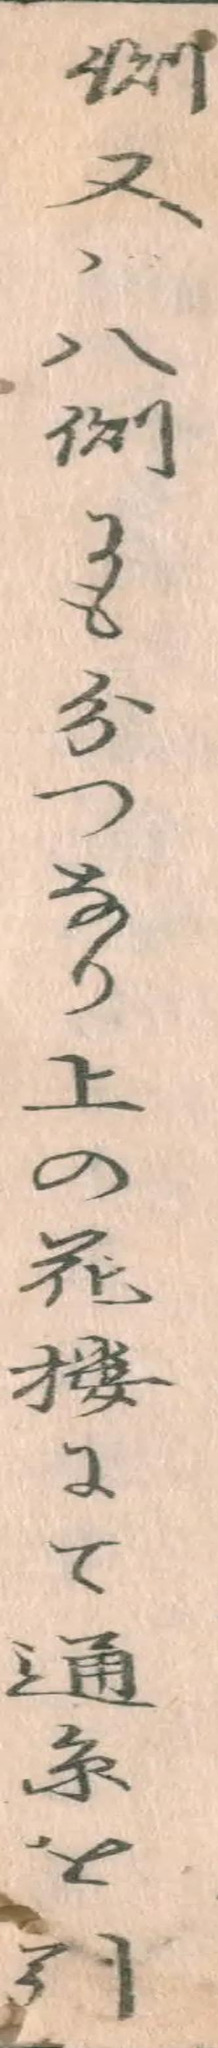側又は八側にも分つなり上の花楼にて通糸を引
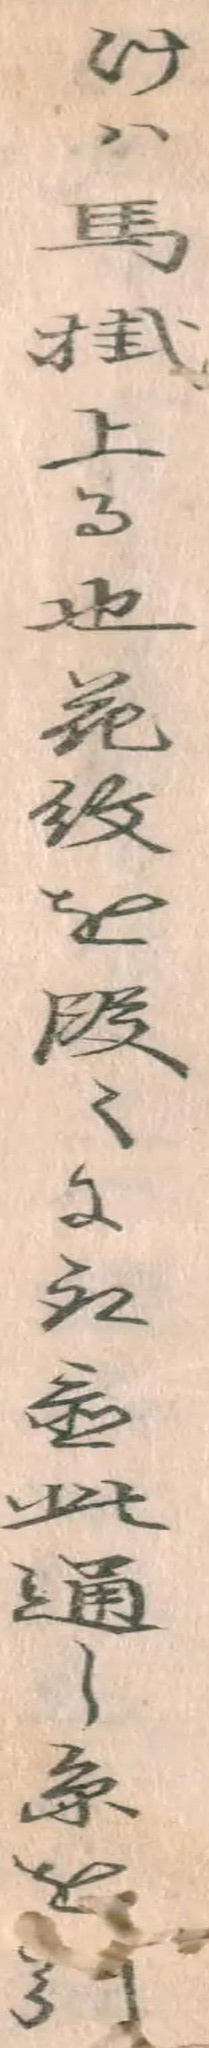けは馬掛上る也花紋を段々に取置此通し糸を引
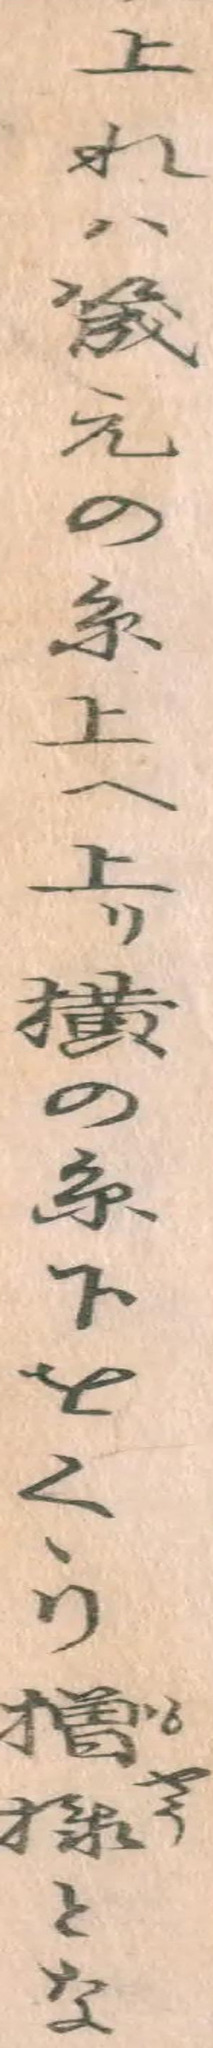上れは筬元の糸上へ上り横の糸下をくゝり橧様とな
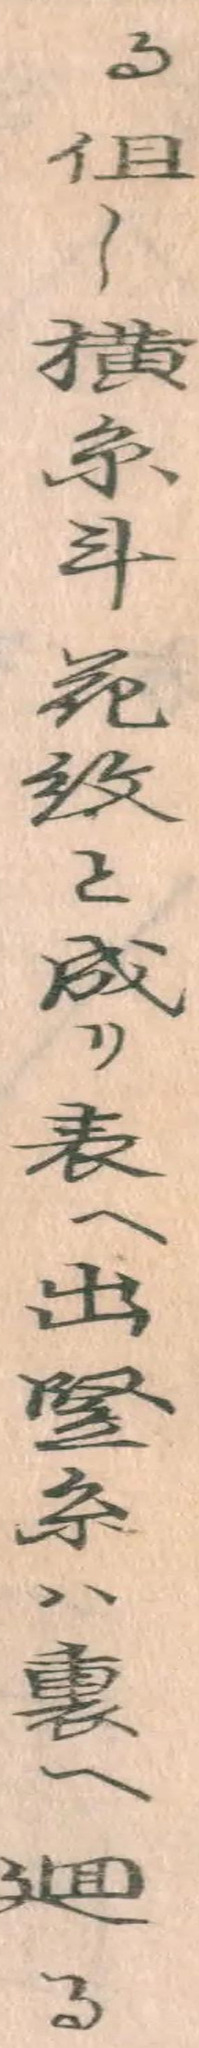る但し横糸斗花紋と成り表へ出竪糸は裏へ廻る
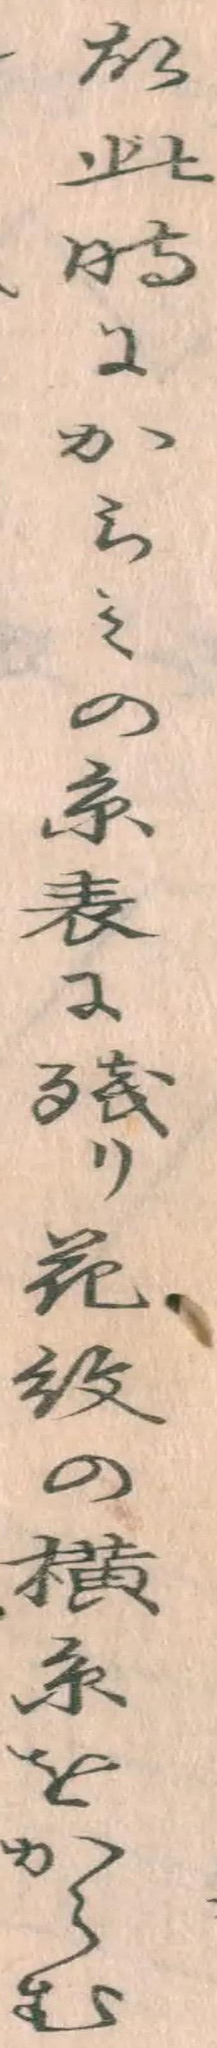故此時にからみの糸表に残り花紋の横糸をからむ
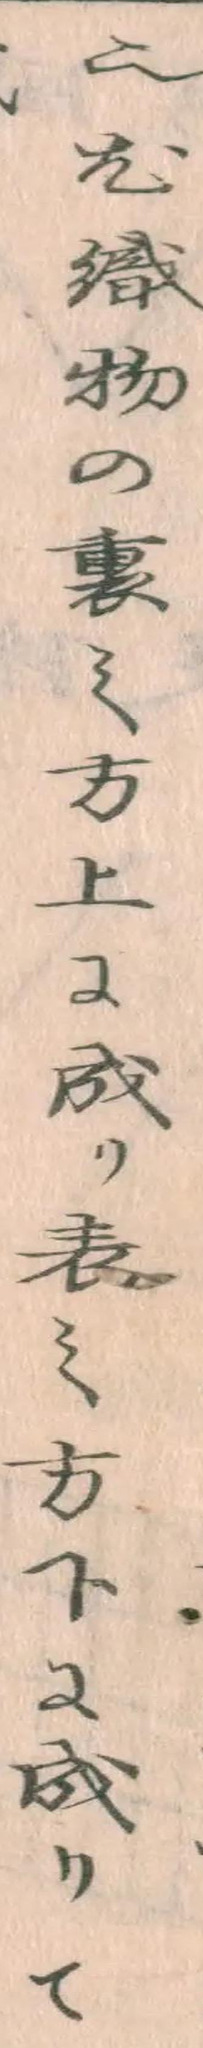也尤織物の裏之方上に成り表之方下に成りて
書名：機織彙編 5巻. [2]
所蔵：国立国会図書館 National Diet Library, JAPAN
